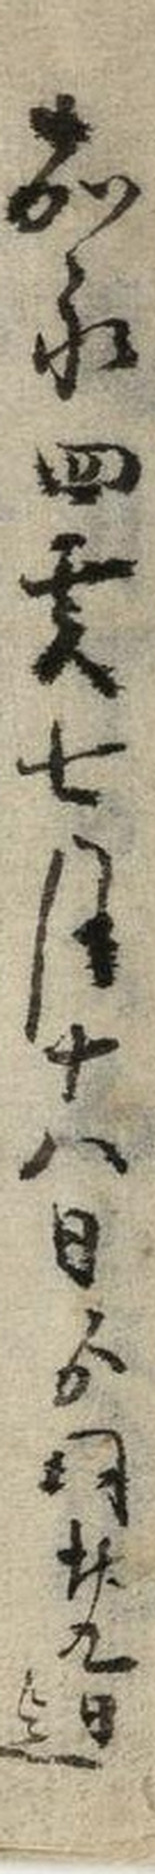嘉永四亥七月十八日ゟ同廿九日
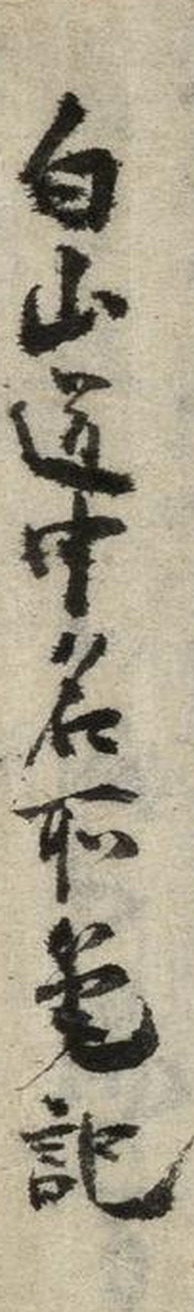白山道中名所筆記
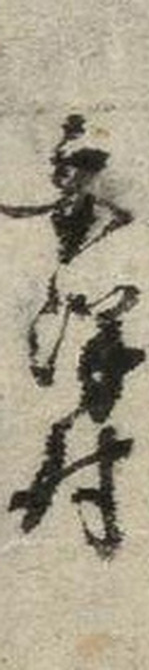安沢村
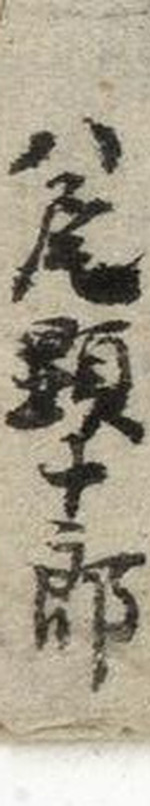八尾顕十郎

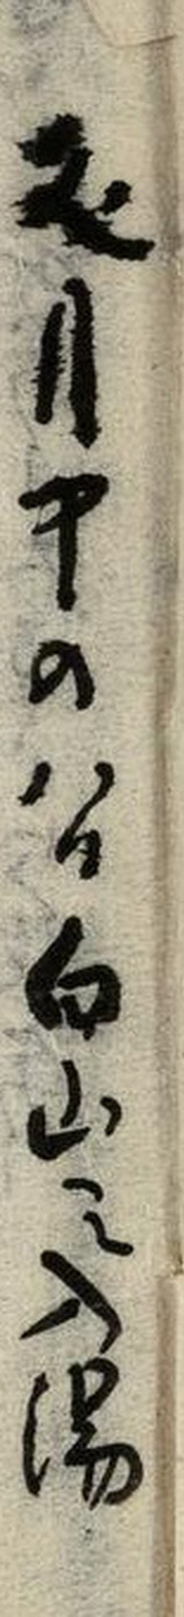正月中の八日白山に入湯
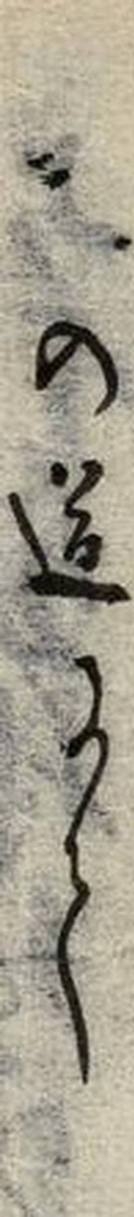の道には
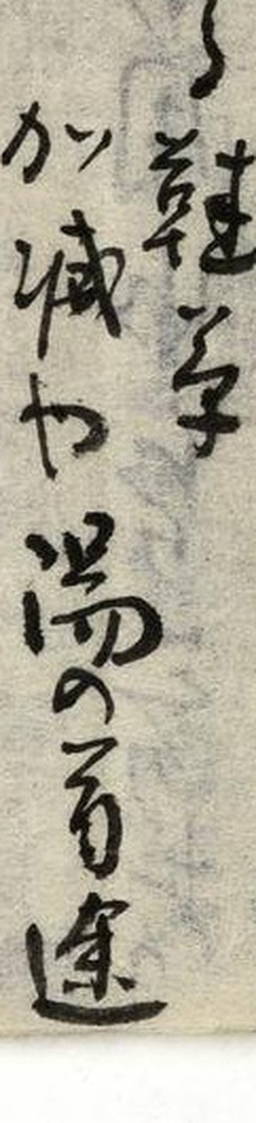加減や湯の首途
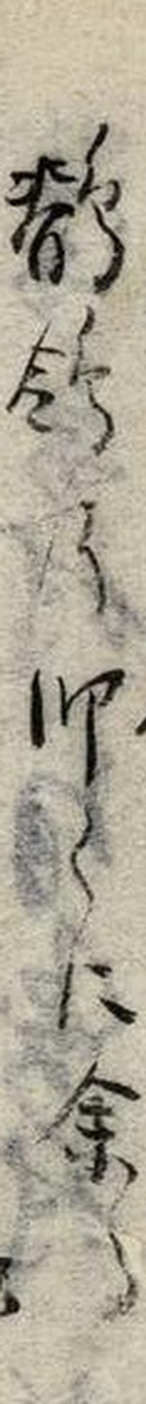鶺鴒の叩くに余る

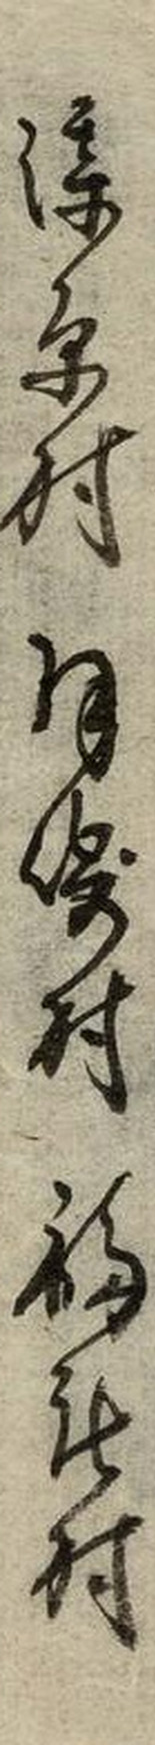漆原村崎村福庄村
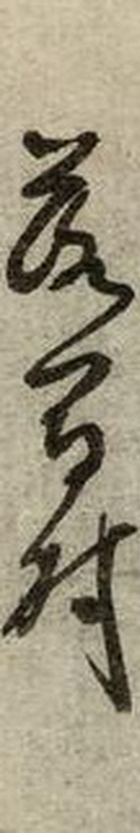落間村
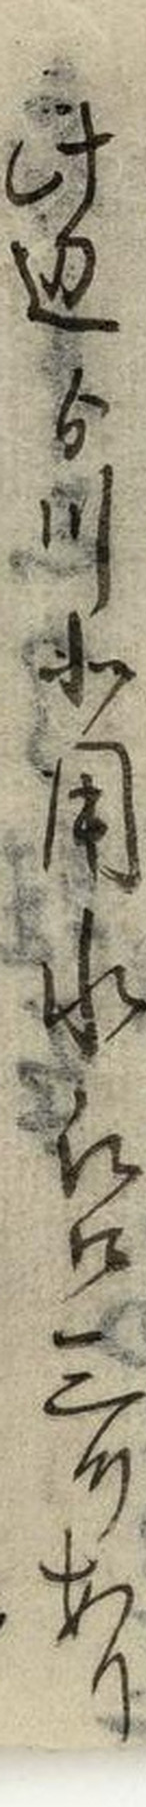此辺ゟ川北用水取口三つあり
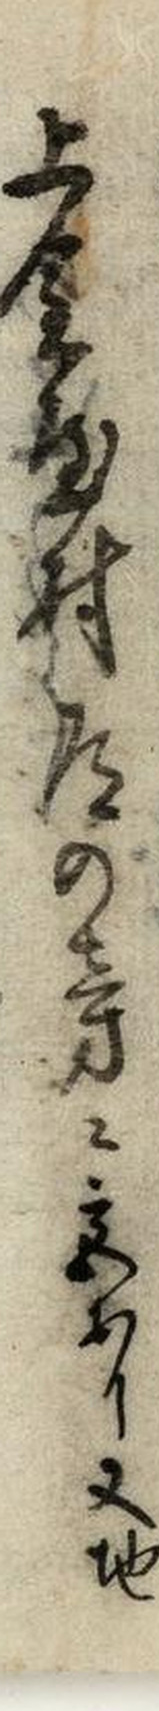上金屋村道の旁ニ宮あり又地
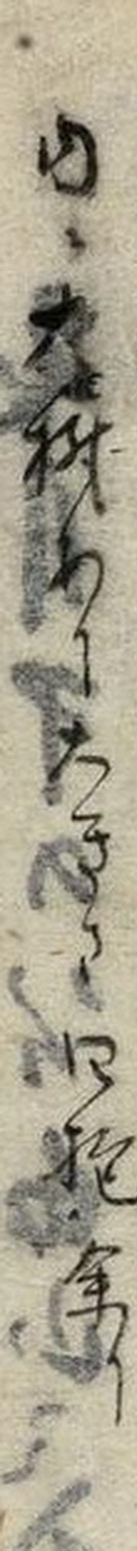内ニ大樹あり大きさ四抱余り
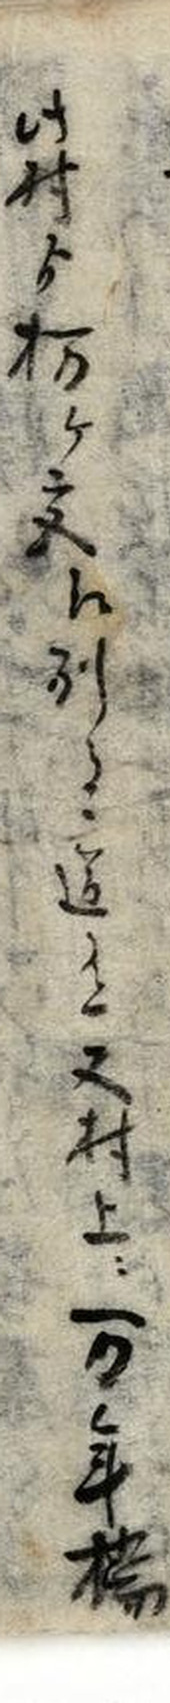此村ゟ栃ケ宮え別る〃道有又村上ニ万年橋
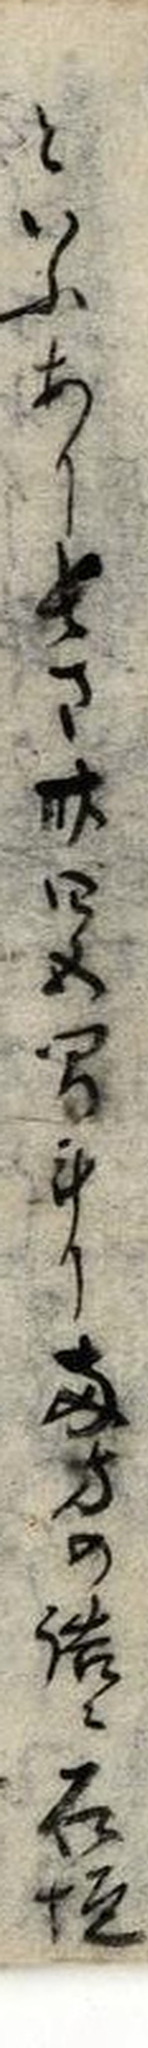といふあり長さ丗四五間斗り両方而しての詰ニ石垣
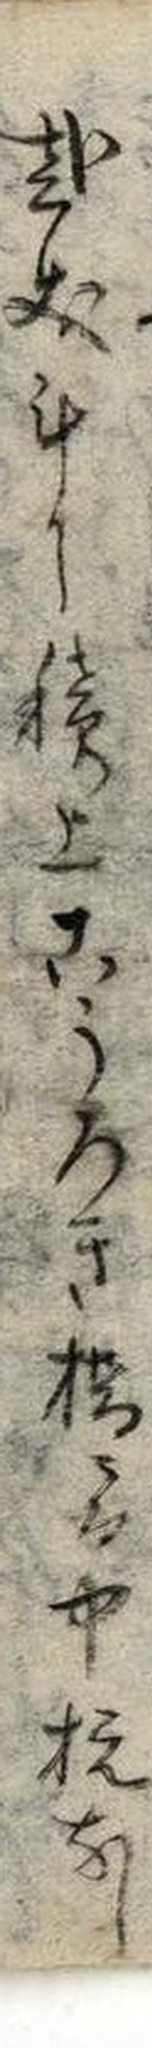弐丈斗り積上げこうろぎ橋ニ而中杭なし
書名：白山道中名所筆記（旅日記）
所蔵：福井県文書館 Fukui Prefectural Archives
